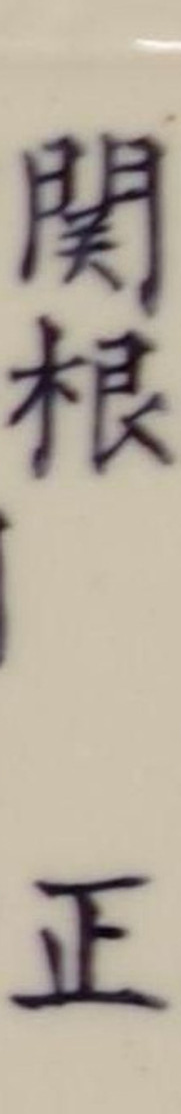開根正
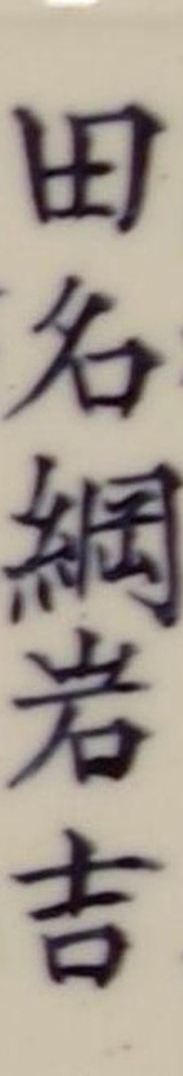田名綱岩吉
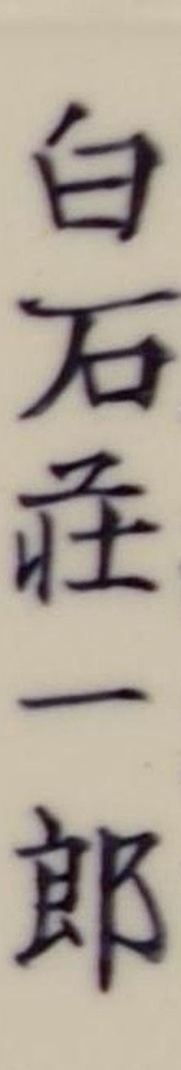白石荘一郎
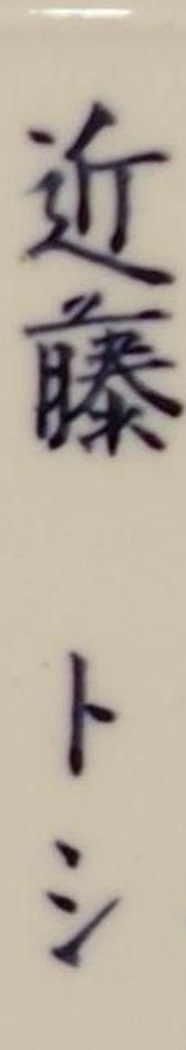近藤トシ
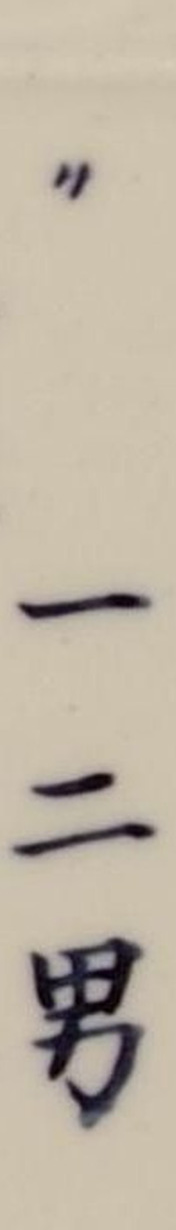一二男
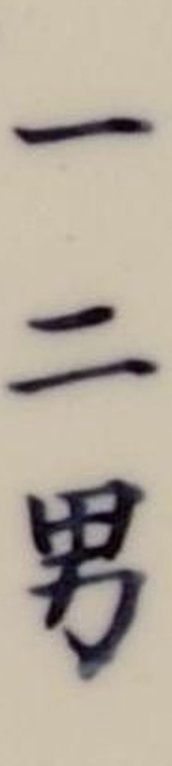一二男
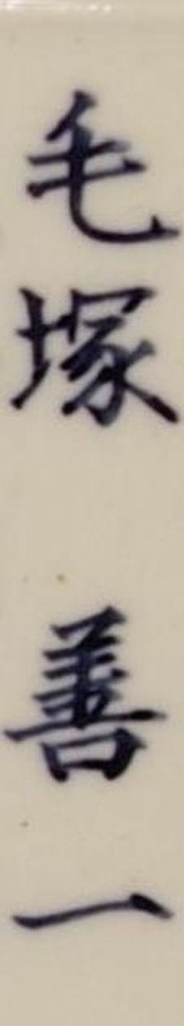毛塚善一
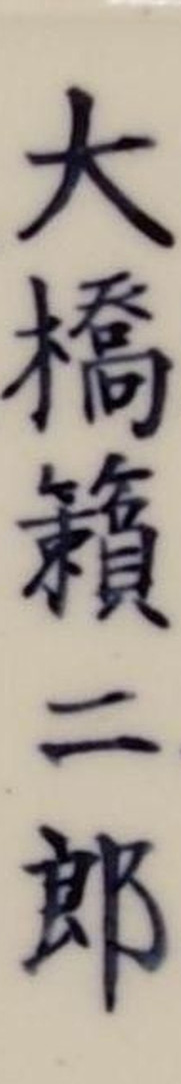大橋籟二郎
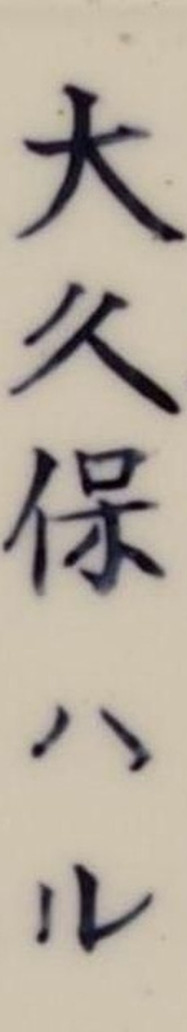大久保ハル
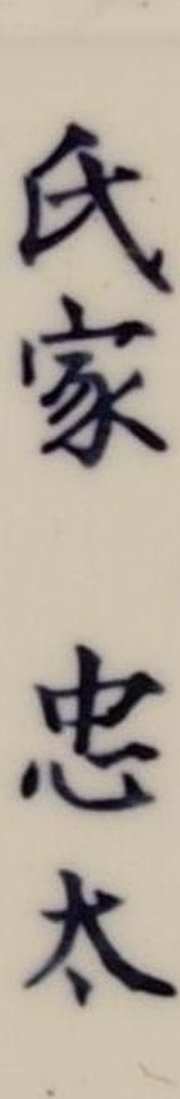氏家忠太
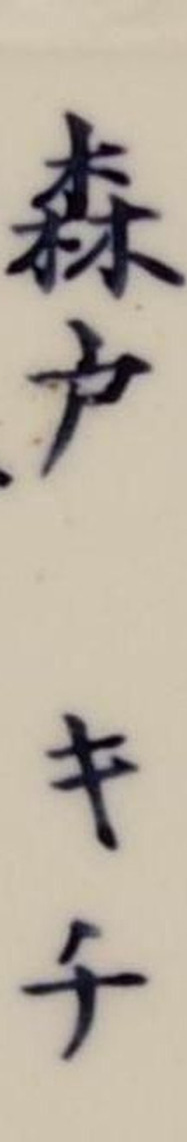森戸キチ
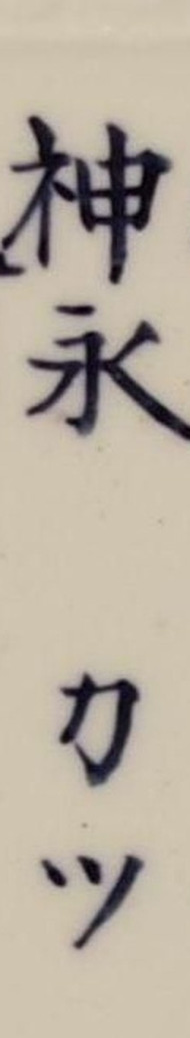神永カツ
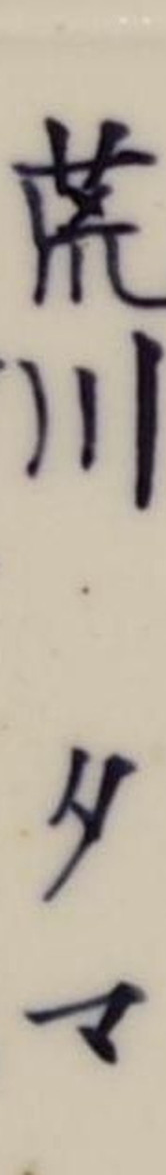荒川タマ
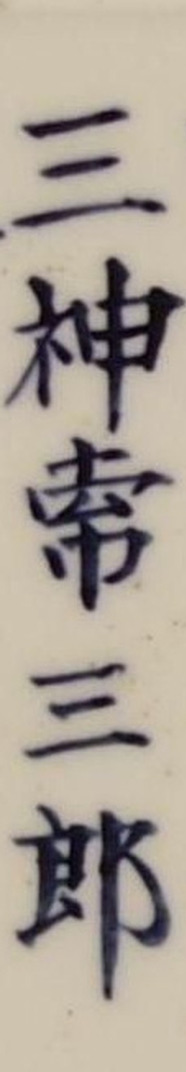三神帝三郎
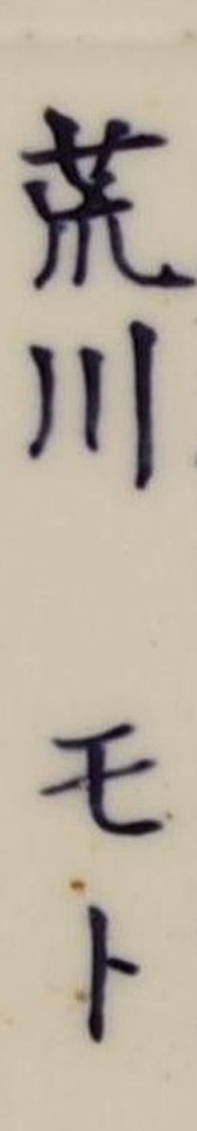荒川モト
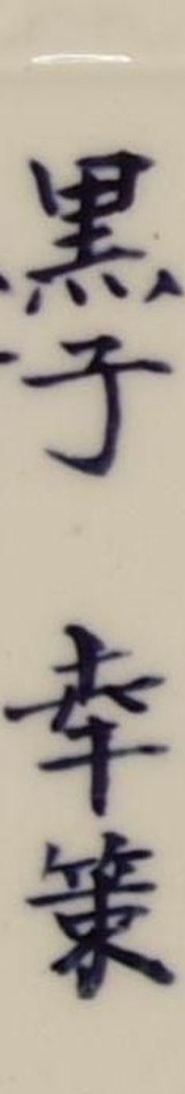黒子幸策
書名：E~L
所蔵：高野山金剛峯寺
